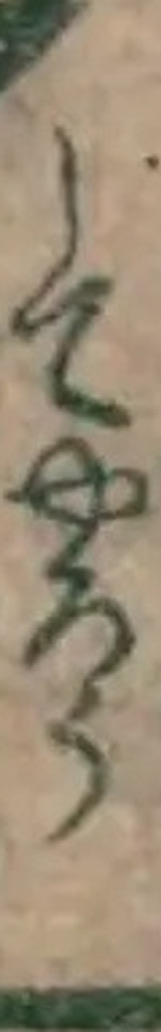してやろう
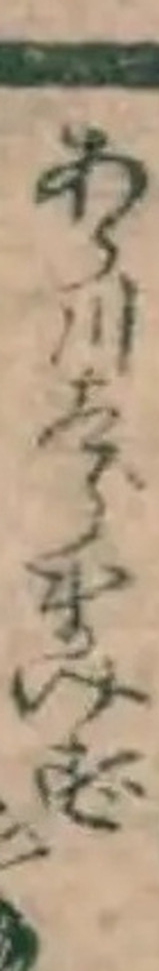あら川太郎まけず
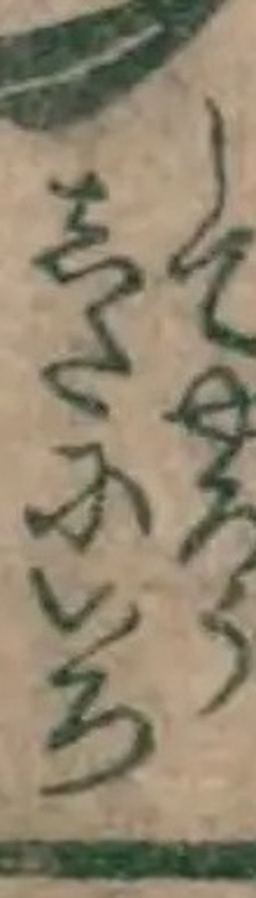したにいろ
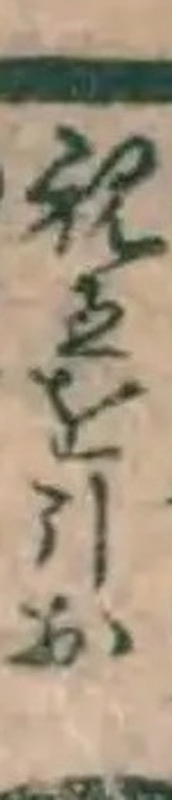親王を引お
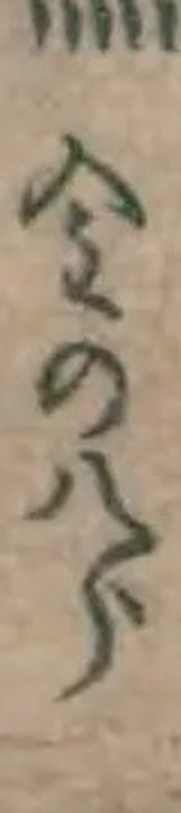金の八郎
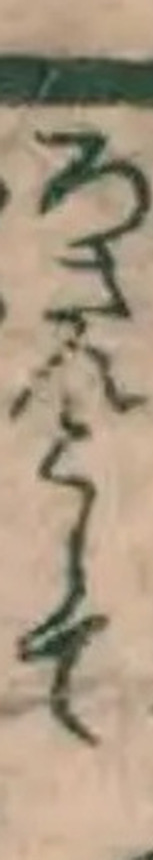ろさんとして
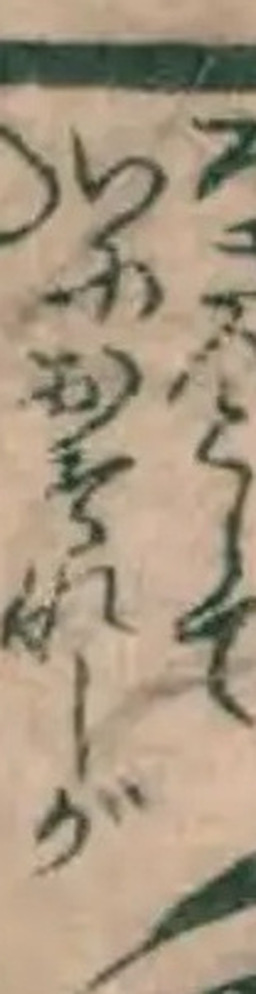いにおそれしが
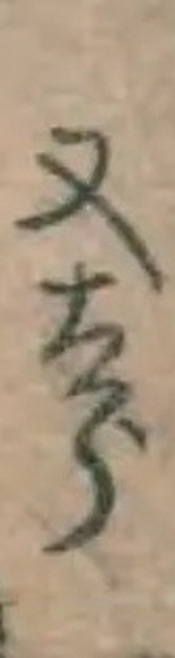又太郎
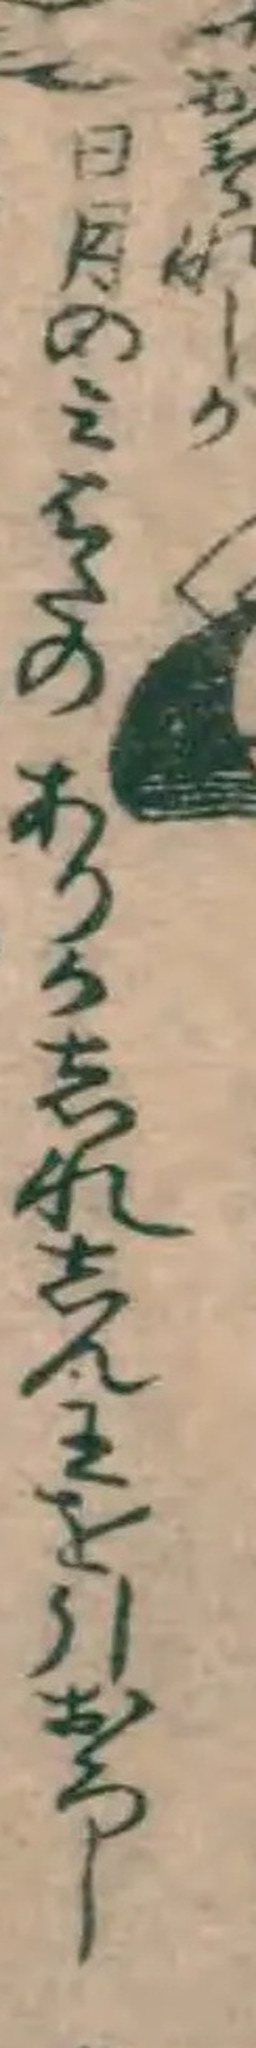日月のみはたのありかしれしん王を引おろし
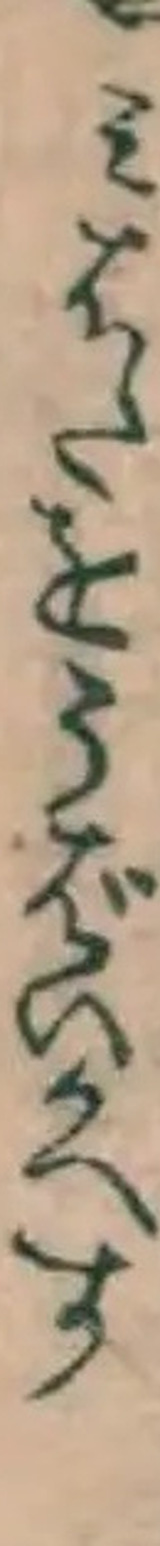みはたをうばいかへす
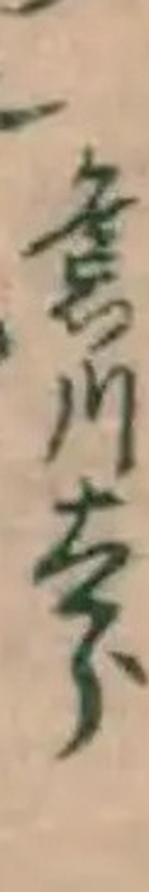荒川太郎
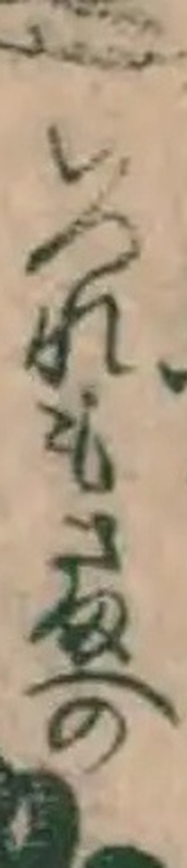いつれもさまへの
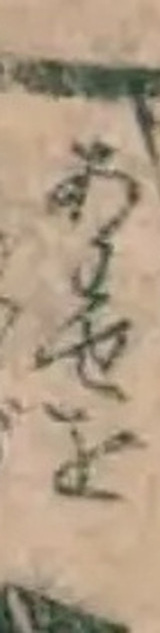あわせを
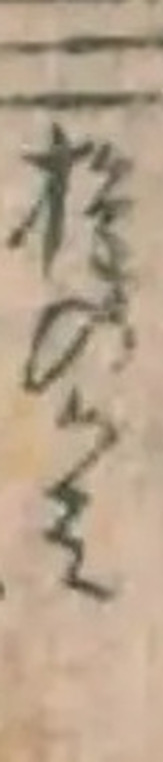権のかみ
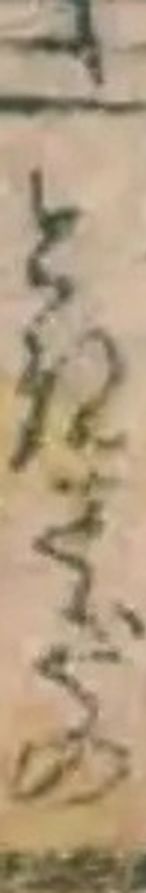ときさだの
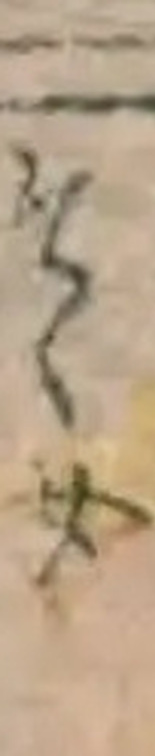そく女
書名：伊達錦對将 : 森田座
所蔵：国立国会図書館 National Diet Library, JAPAN
